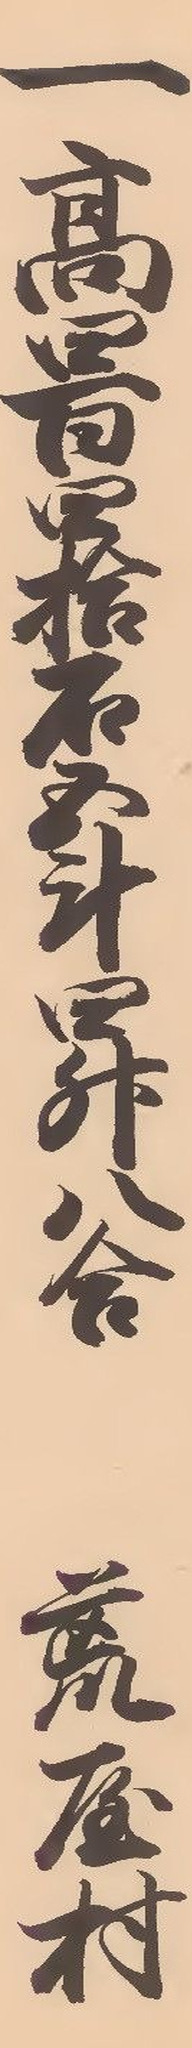一高四百四拾石五斗四升八合荒屋村

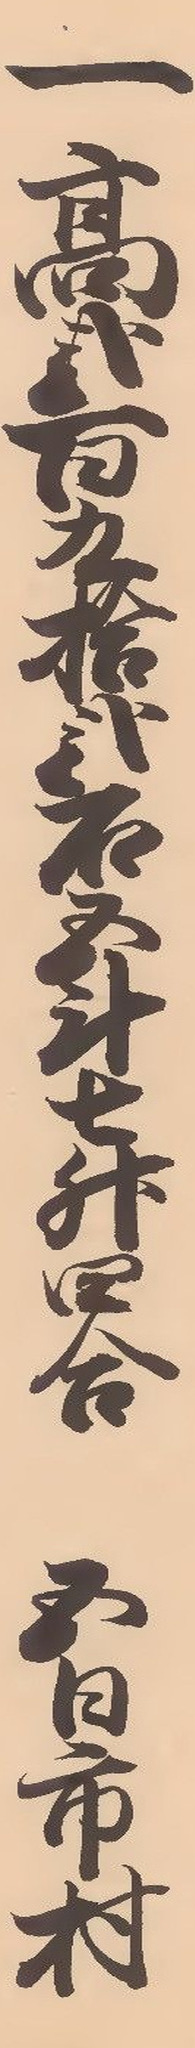一高弐百九拾弐石五斗七升四合五日市村
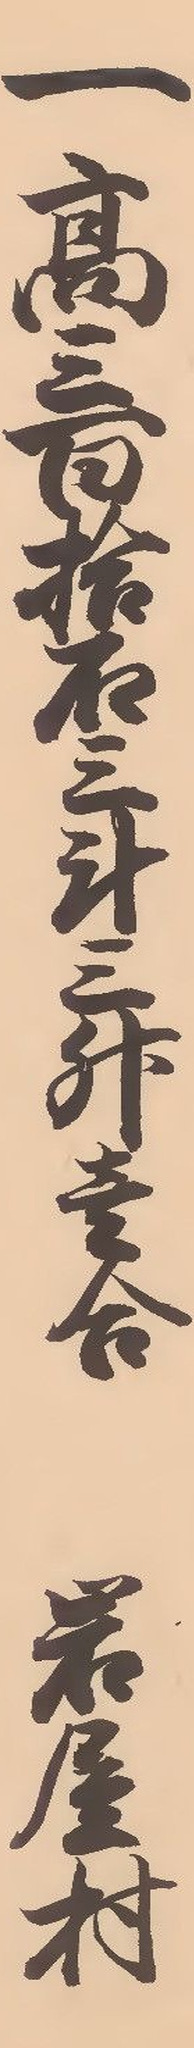一高三百拾石三斗三升壱合岩屋村
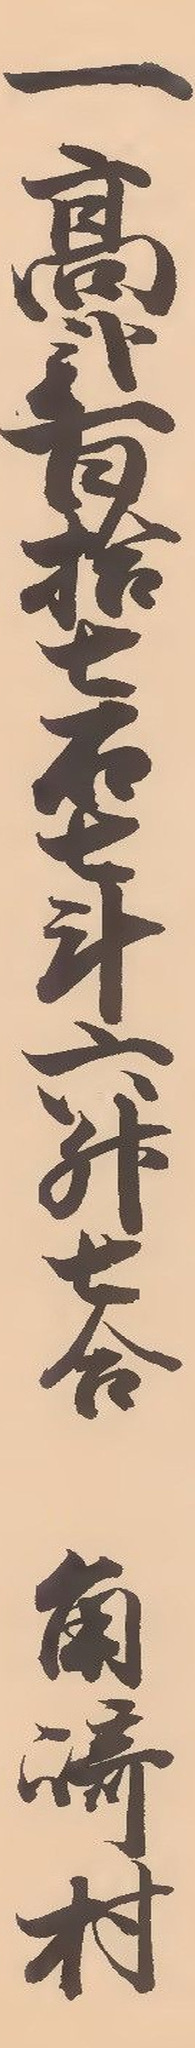一高弐百拾七石七斗六升七合角崎村
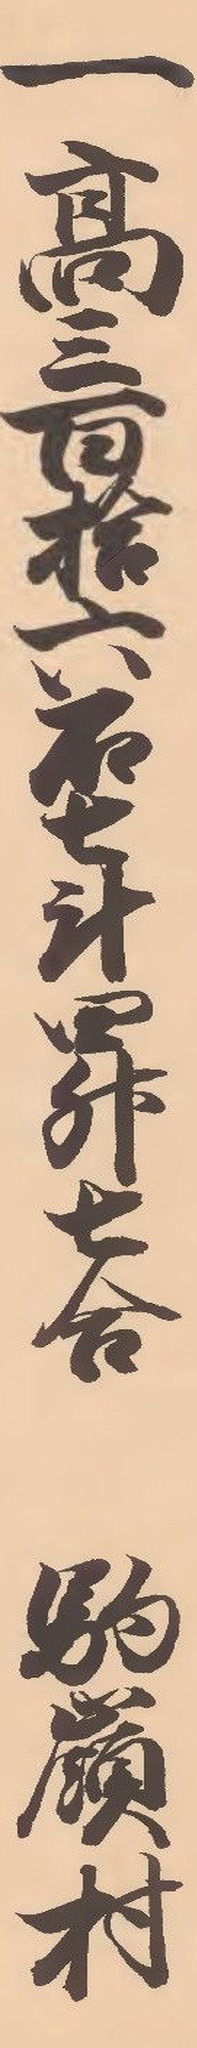一高三百拾六石七斗四升七合駒嶺村
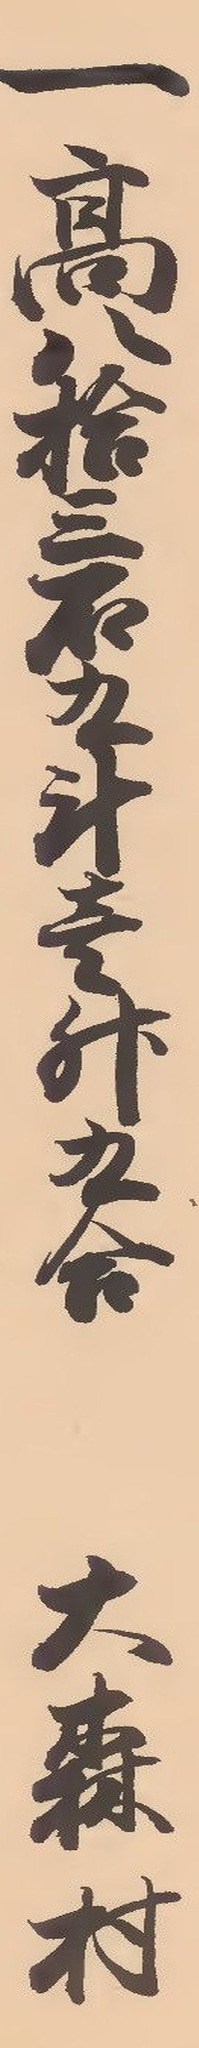一高八拾三石九斗壱升九合大森村
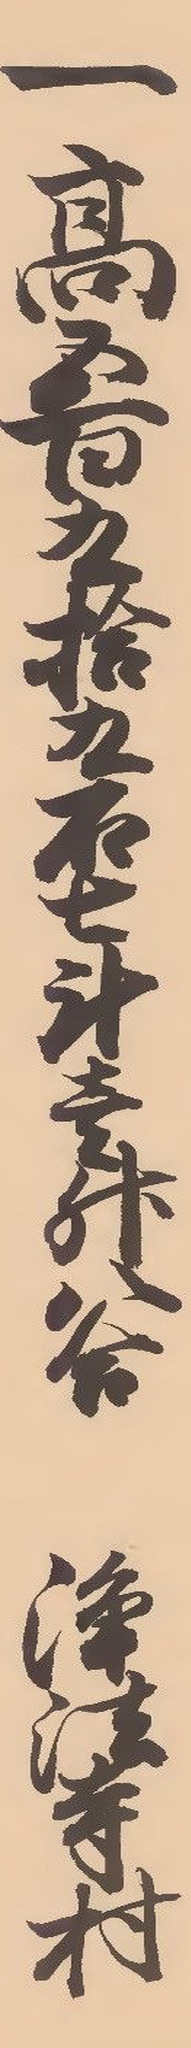一高五百九拾九石七斗壱升八合浄法寺村
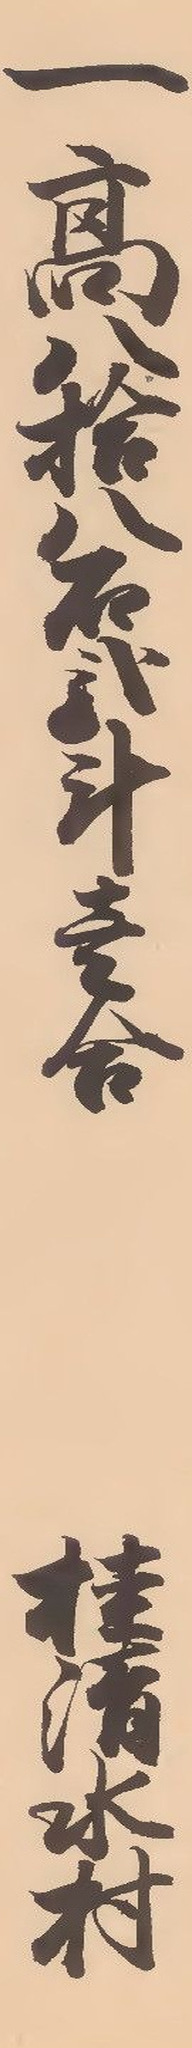一高八拾八石弐斗壱合桂清水村
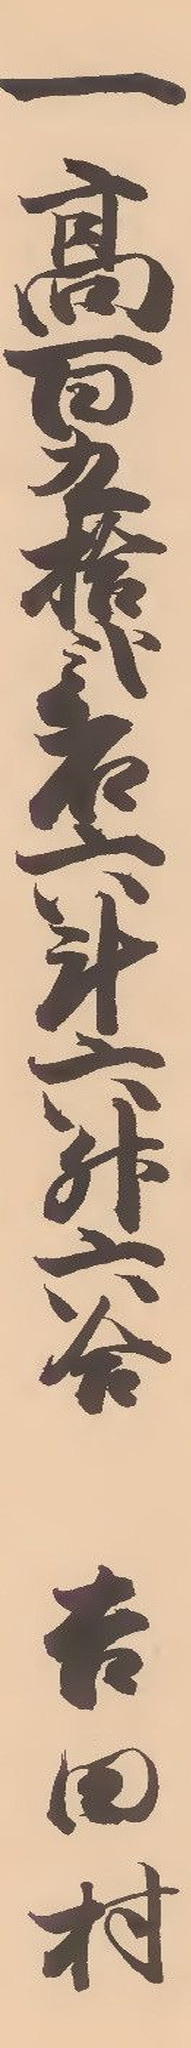一高百九拾弐石六斗六升六合吉田村

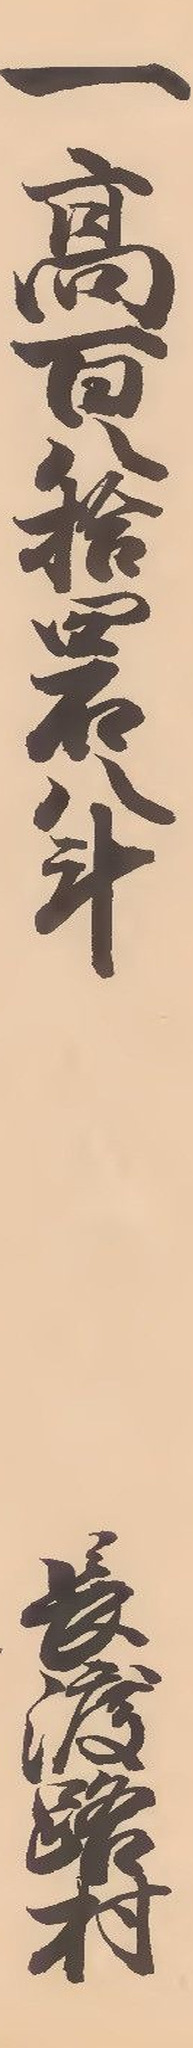一高百八拾四石八斗長渡路村
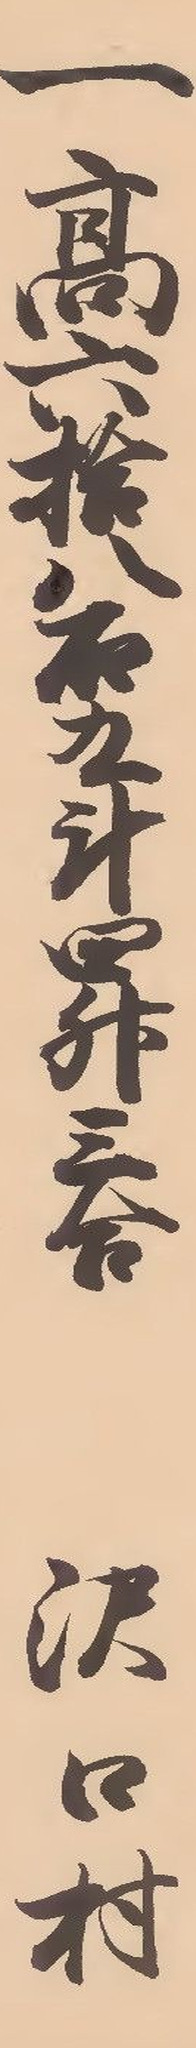一高六拾八石九斗四升三合沢口村
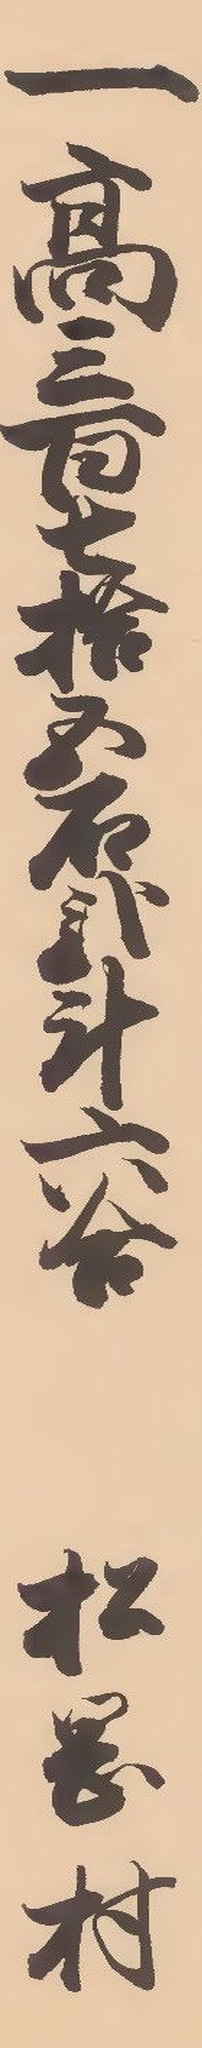一高三百七拾五石弐斗六合松岡村
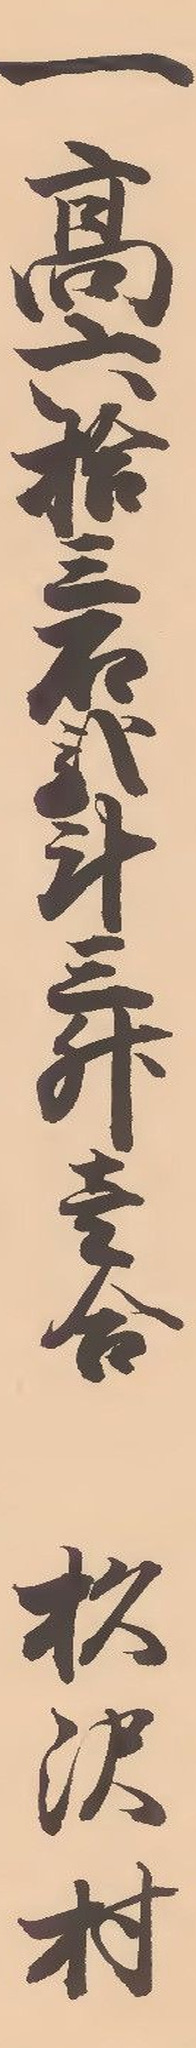一高六拾三石弐斗三升壱合杉沢村
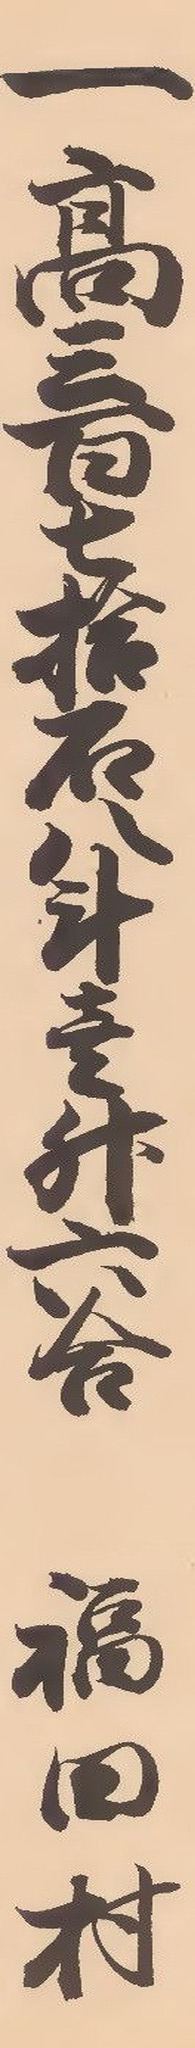一高三百七拾石八斗壱升六合福田村
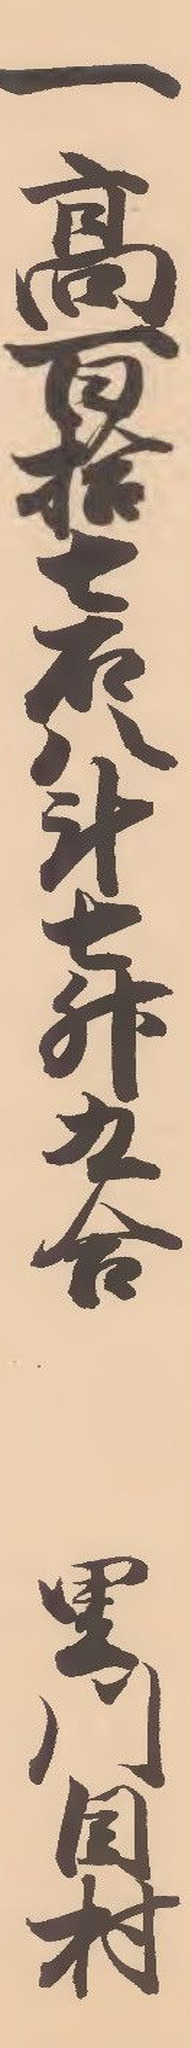一高百拾七石八斗七升九合里川目村
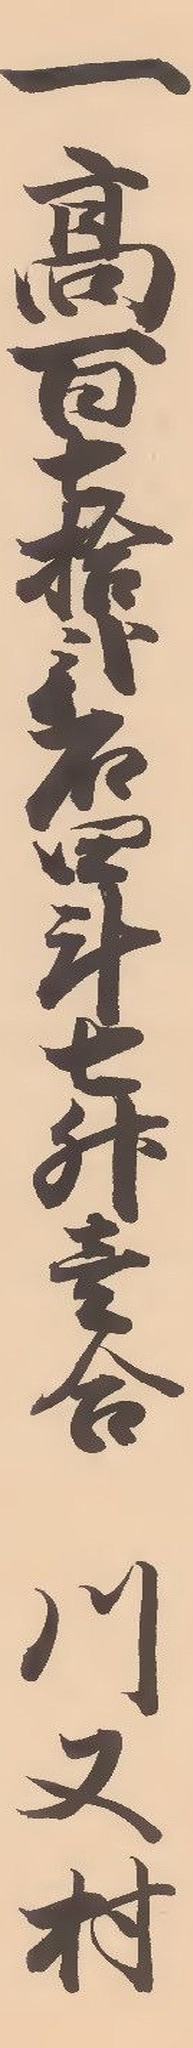一高百七拾弐石四斗七升壱合川又村
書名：陸奥国郷帳　６
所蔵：国立公文書館 National Archives of Japan
